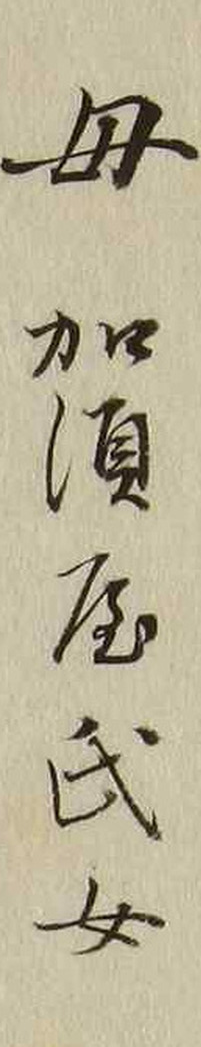母加須屋氏女
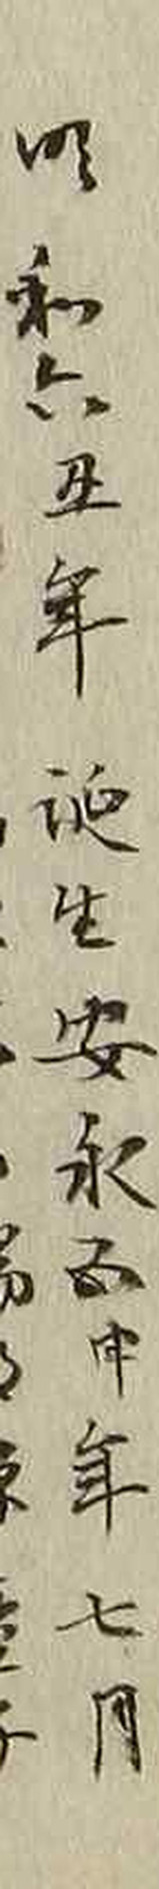明和六丑年誕生安永五申年七月
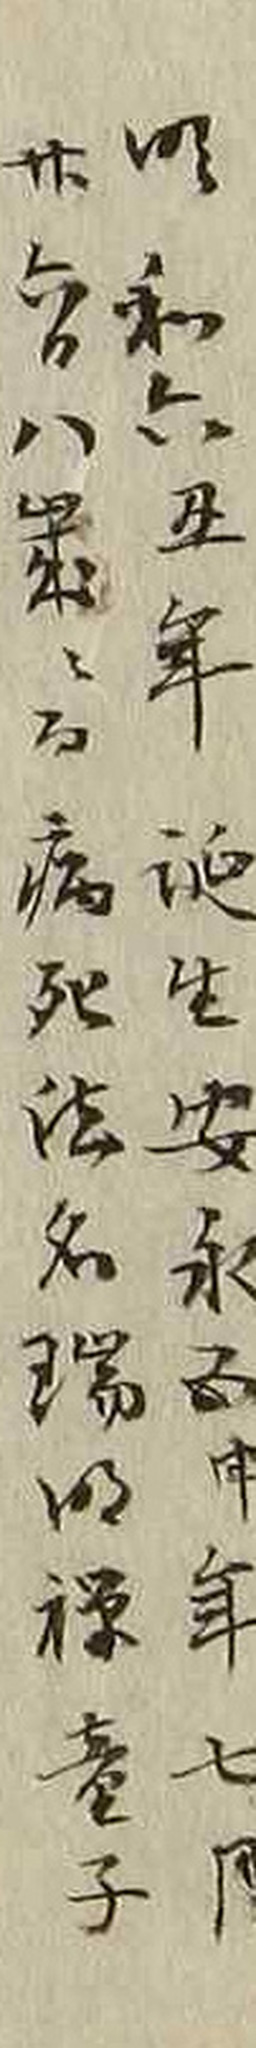忠蔵廿六日八歳ニて病死法名瑞明禅童子
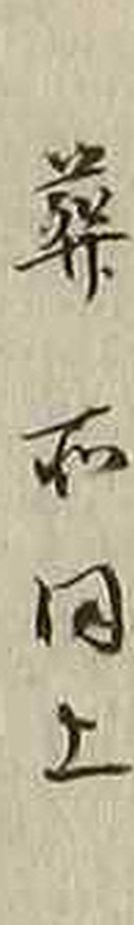葬所同上
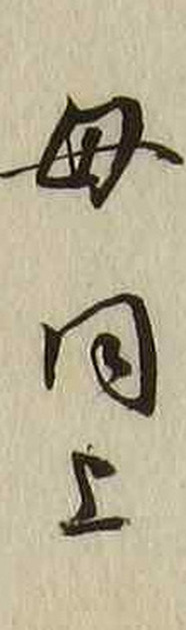母同上
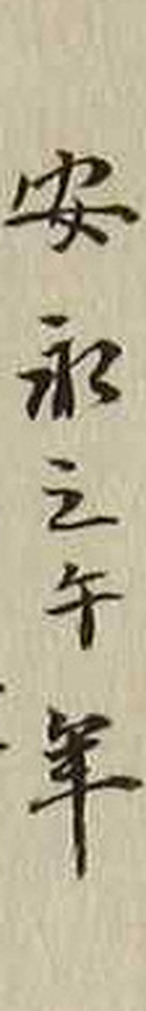安永三午年
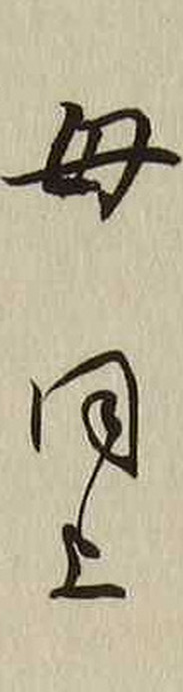母同上
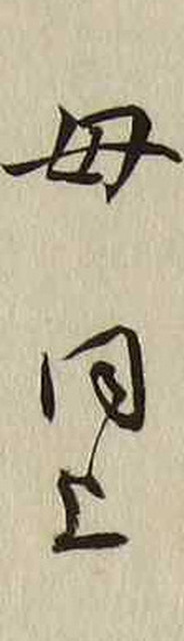母同上
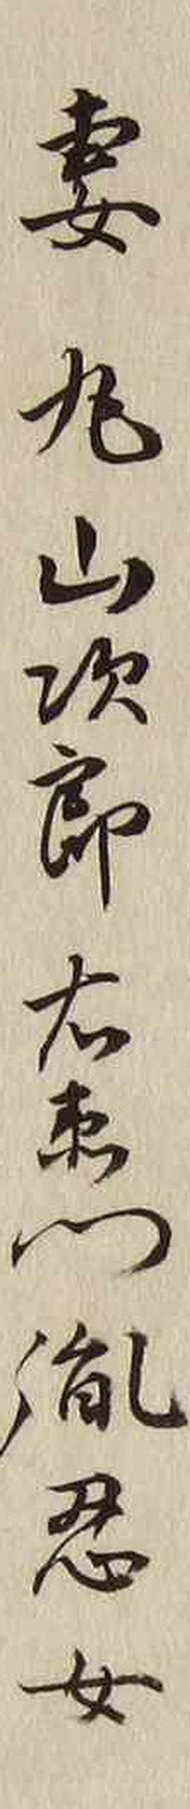妻丸山次郎右衛門胤忍女
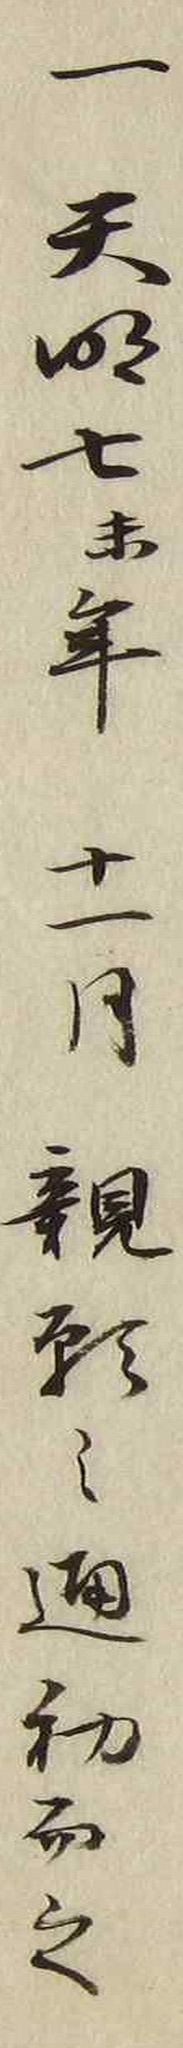一天明七未年十一月親願い之通初めて之

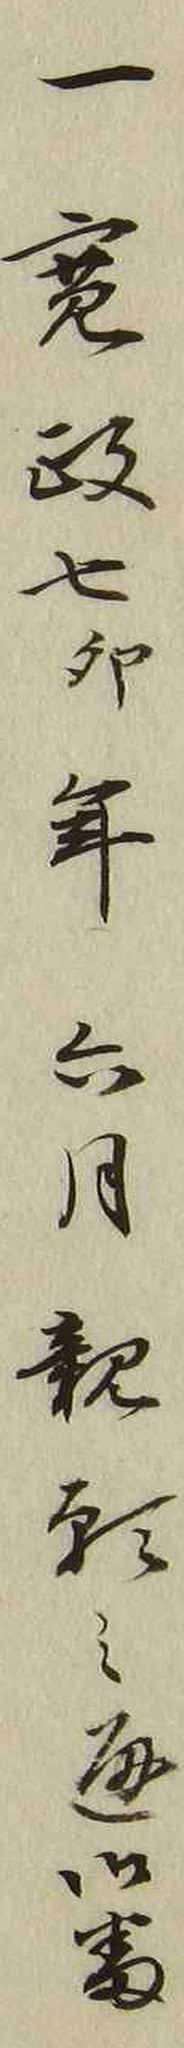一寛政七卯年六月親願い之通御番
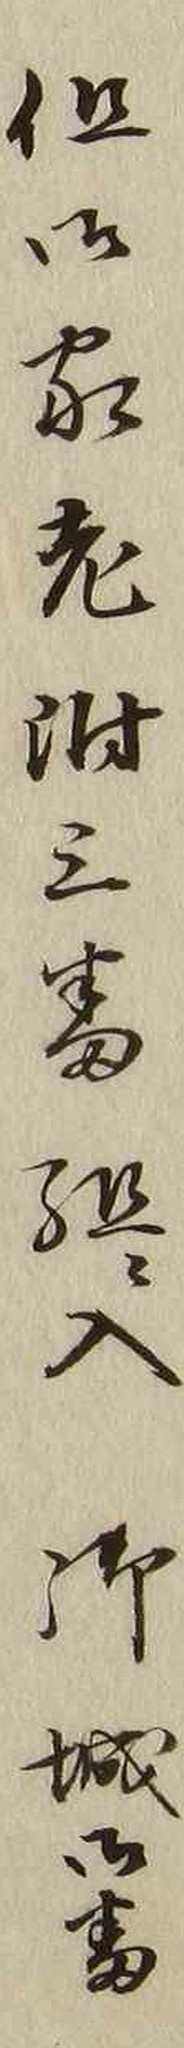但し家老附き三番組ニ入御城御番
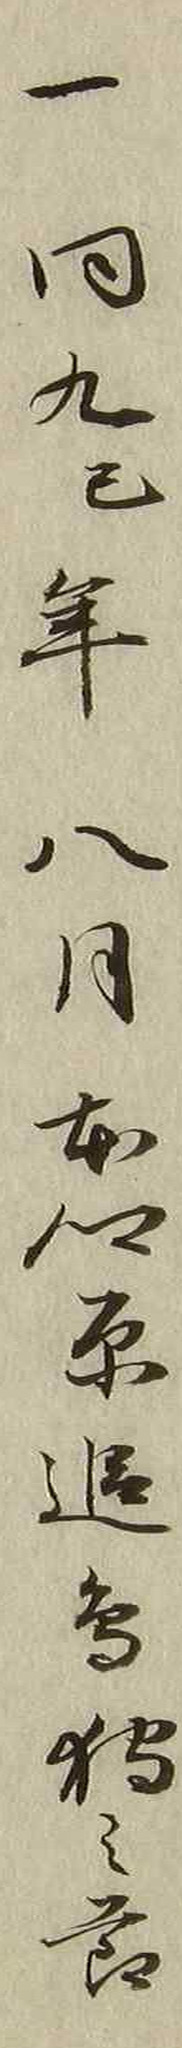一同九巳年八月本郷原追鳥狩之節
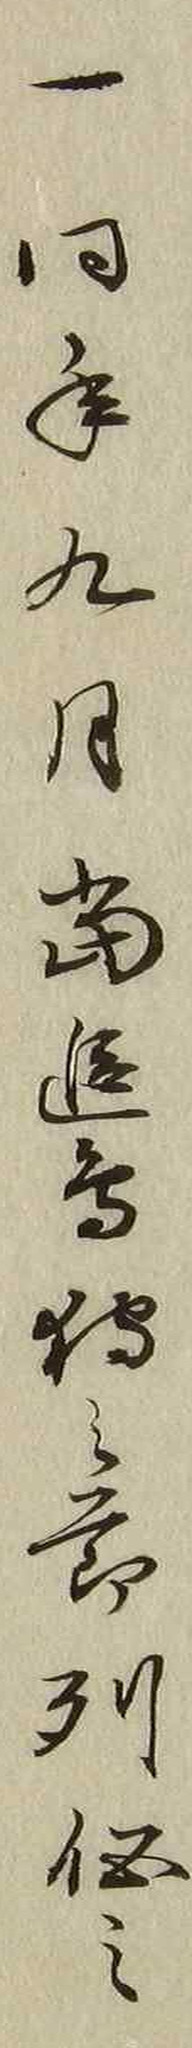一同年九月当追鳥狩之節列伍之
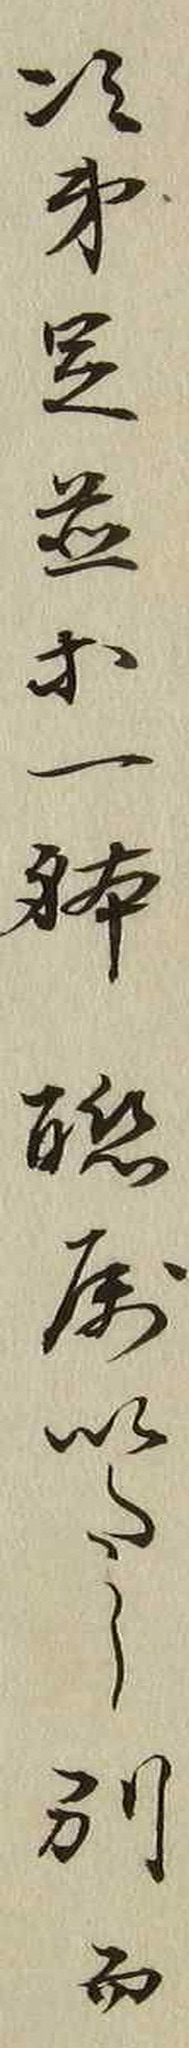次第足並等一体聯属いたし別して
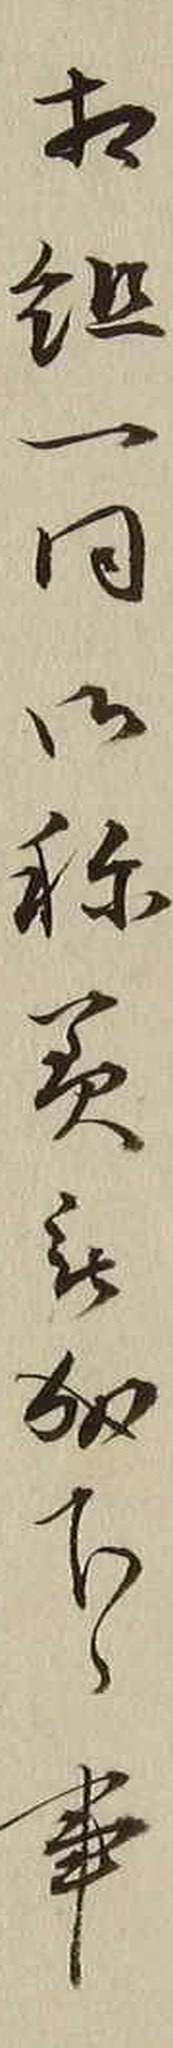相組一同御称美成し下され候事
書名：諸士系譜　巻之16　い之部16
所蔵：会津若松市立会津図書館
